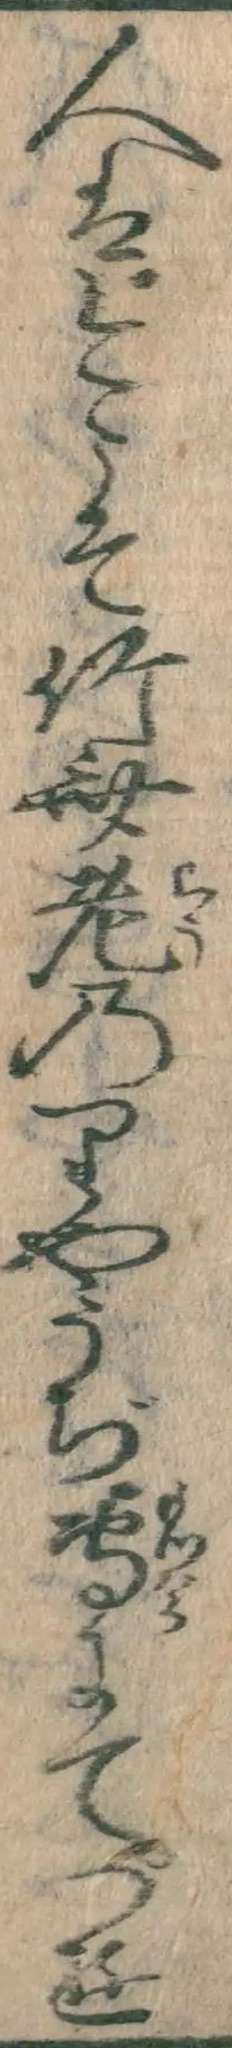人は、今こそ竹斎老のりやうぢ、専にて。つゆ

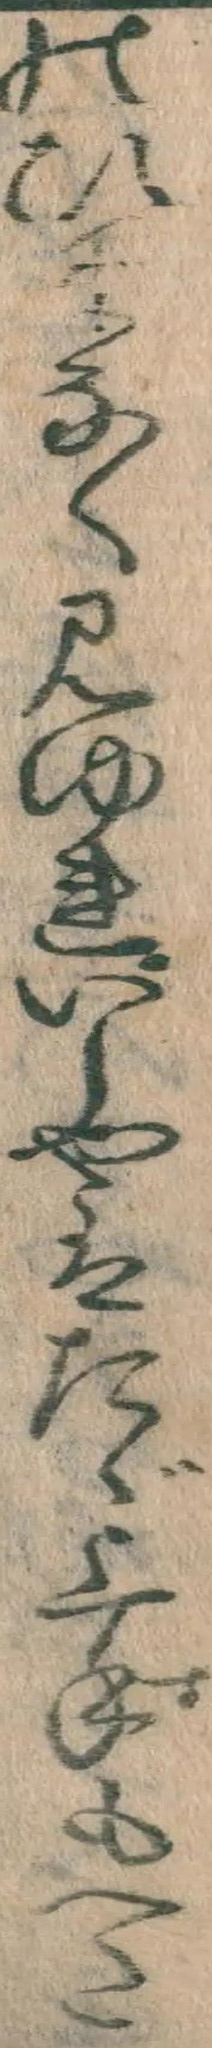のひなく見ゆれ、いしやはたゞ上手もへた
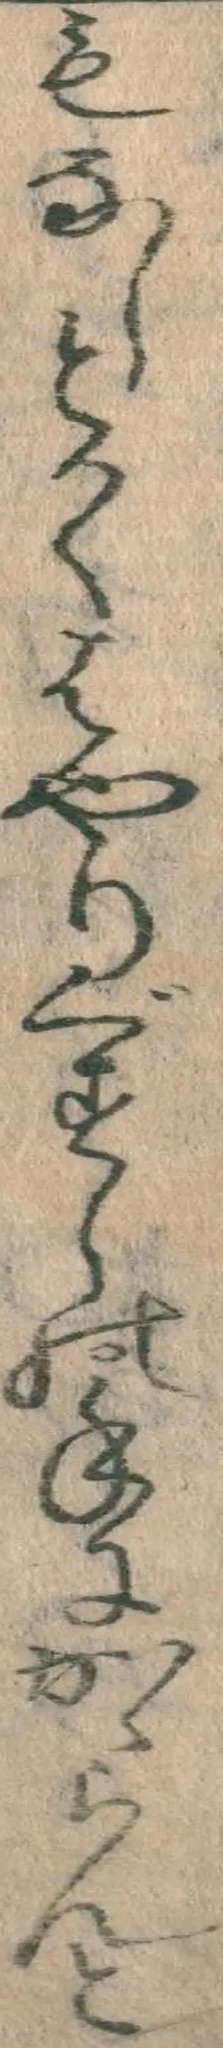もなしとかくはやりぐすしの。手にかゝらんと
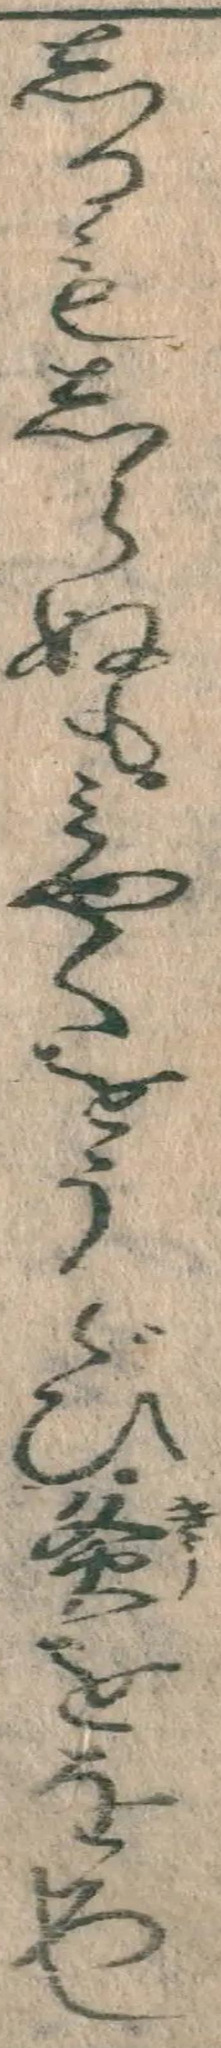しるもしらぬも、みやくをう[か]ゞひ、灸ををろし
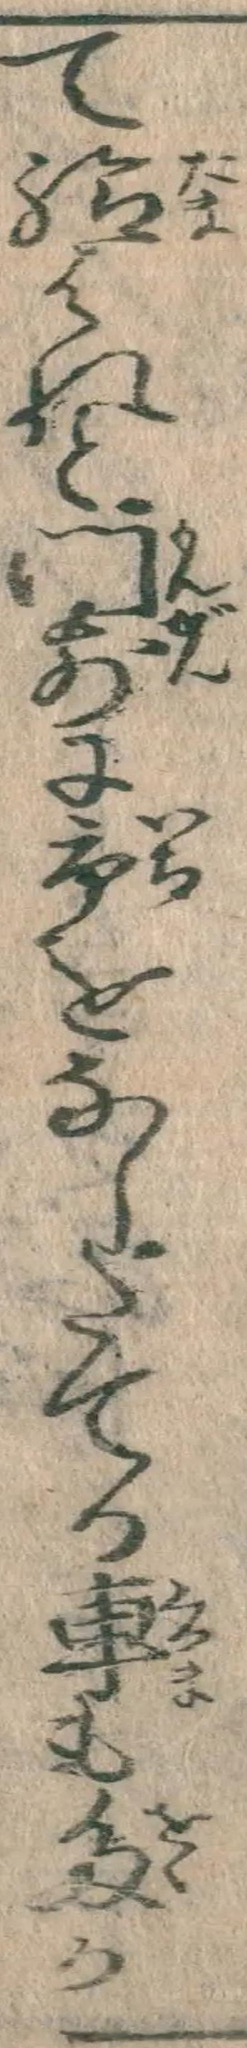て給はれと、門前に市をなし、たてる車も多か
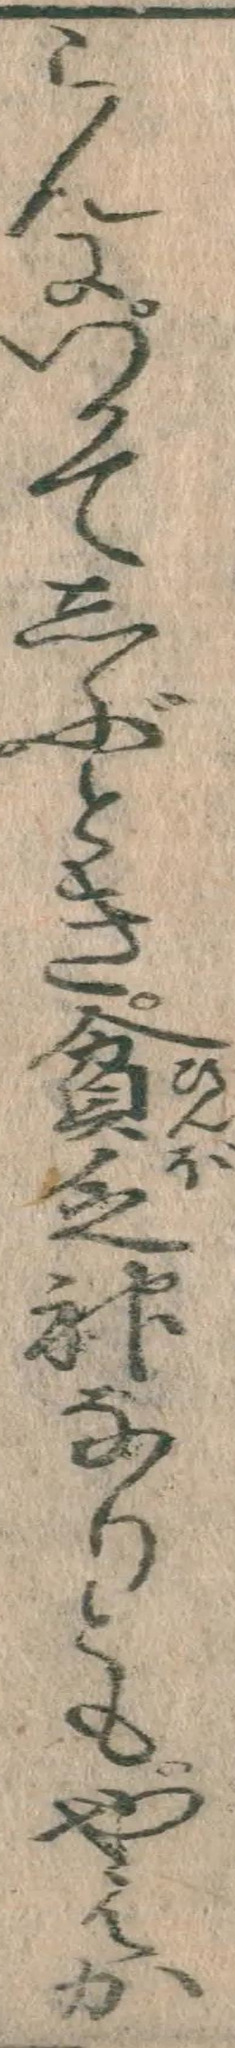らんに。いかてしぶとき。貧乏神なりとも。やはか
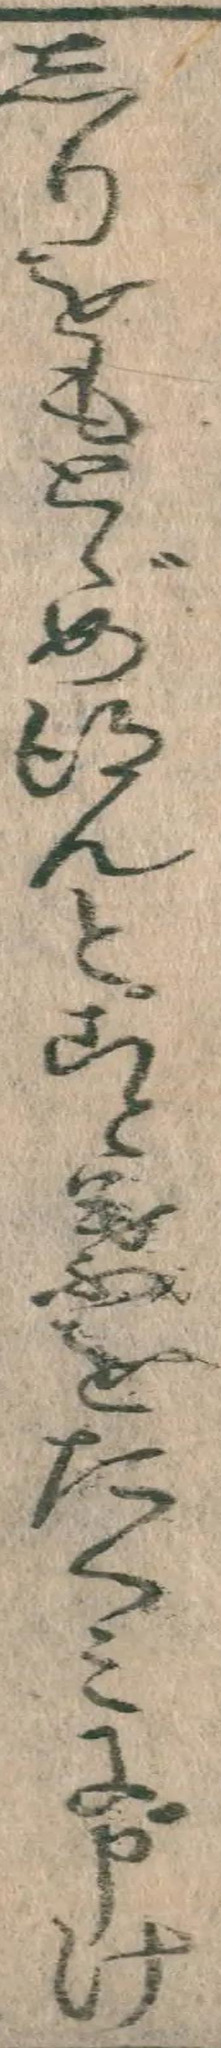しりをもとゞめ得んと。こと葉をたくみに、申け
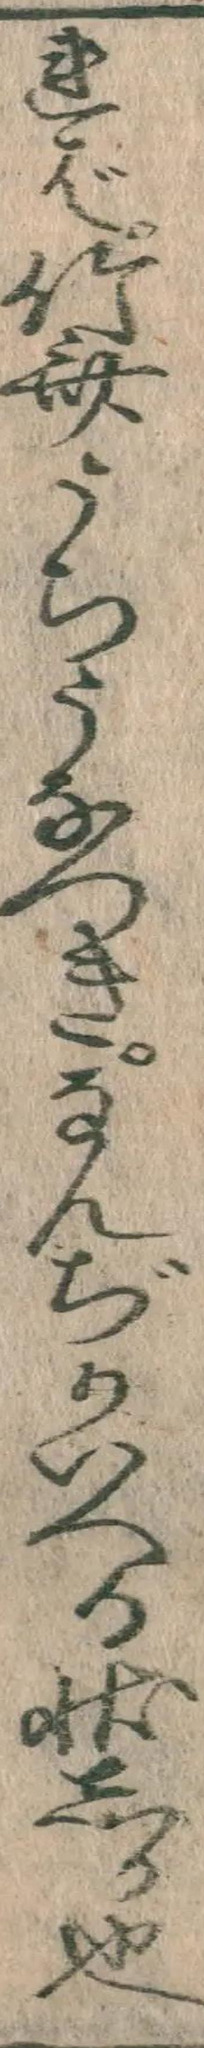れば。竹斎うちうなつき。なんぢかいへる状しる也
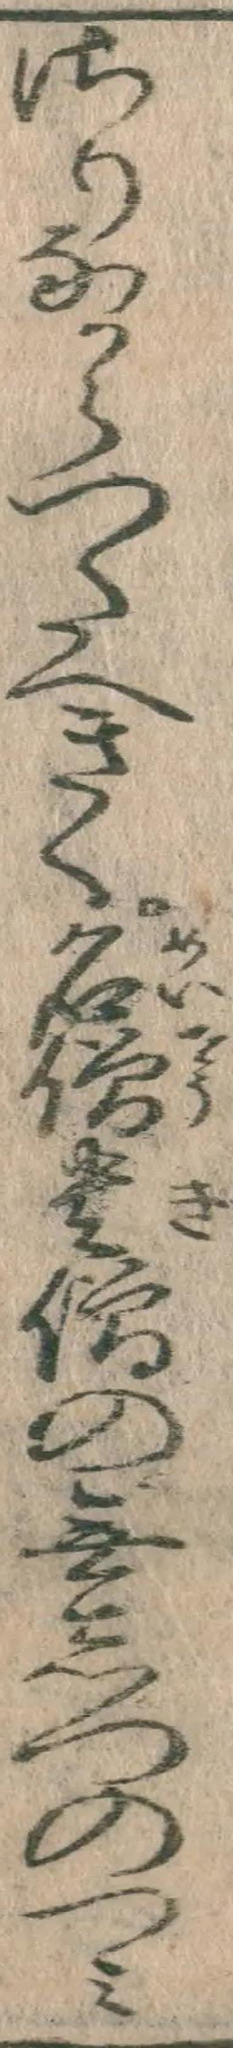さりなからつたへきく。名僧貴僧の無しつのつみ
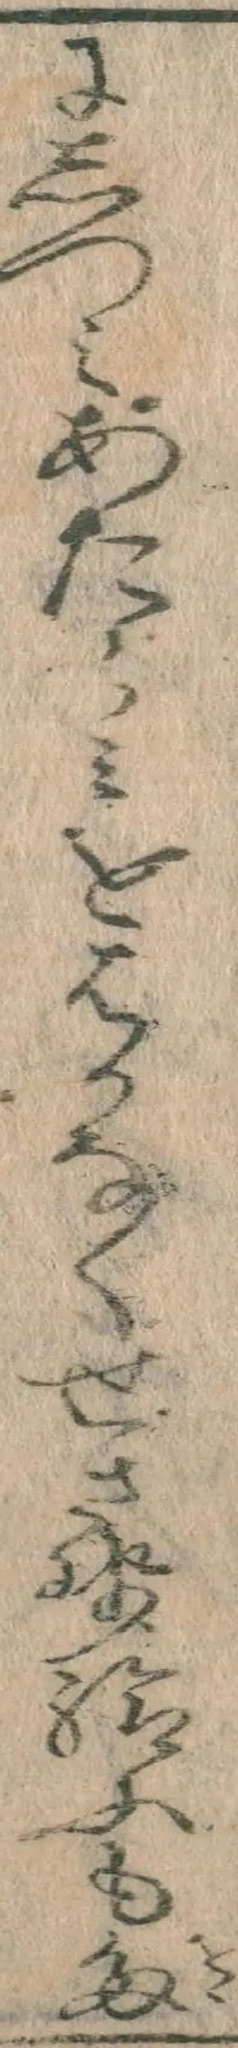にしつみ、あたらみをはかなくせさせ給ふも多
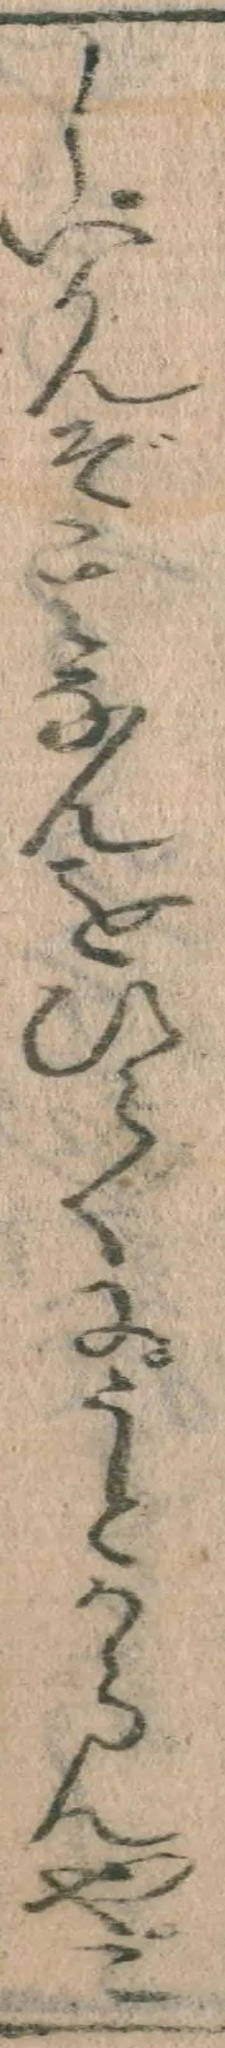し、いかんぞ其なんをひらくに。うとからんや。こ
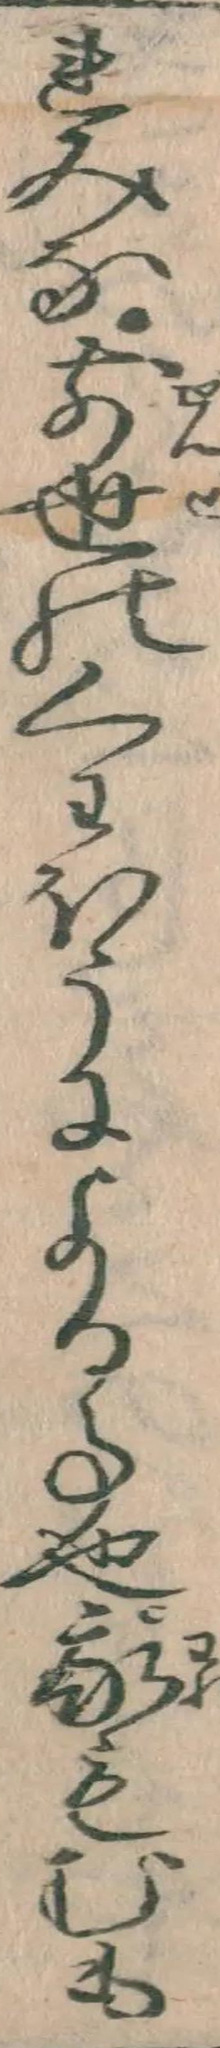れみな、前世のくわほうによる事也。我もむも
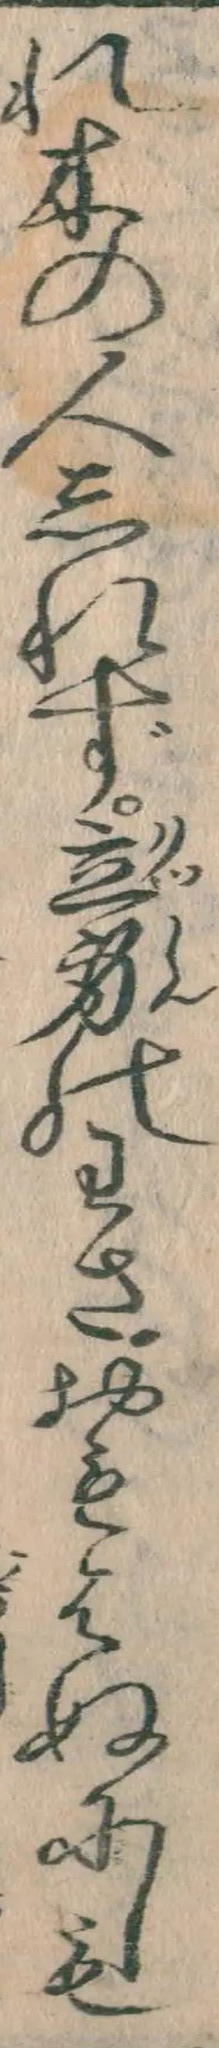れ木の人しれず。立身のわさ、おもはぬにしも
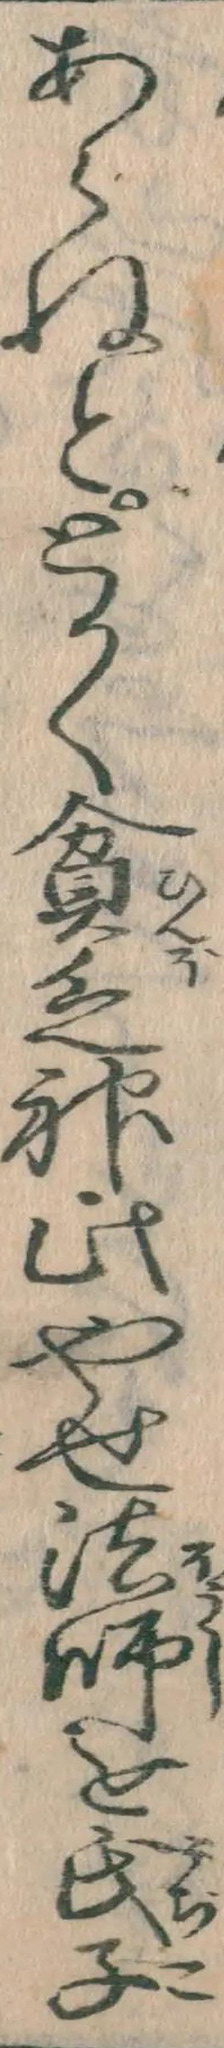あらねと。とかく貧乏神、此やせ法師を氏子
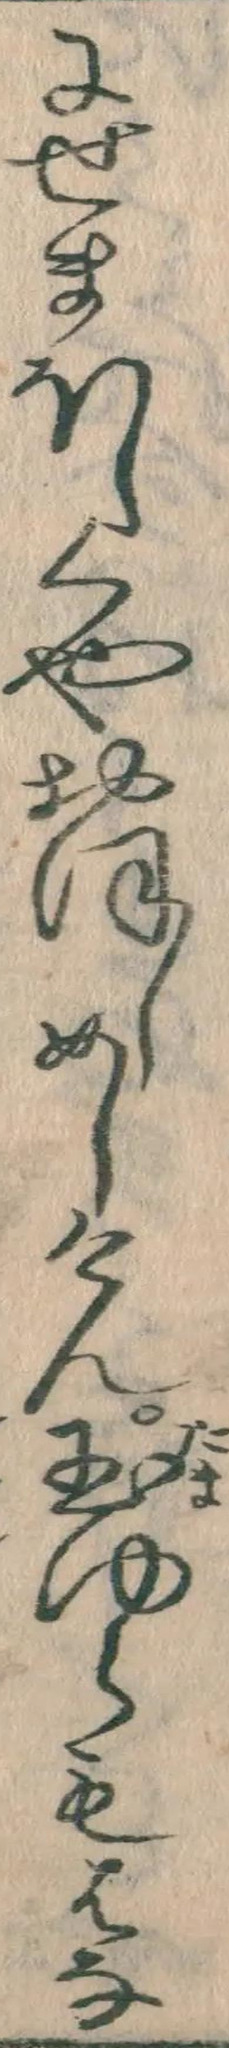にせまほしくやおほしめしけん。玉ゆらもはな
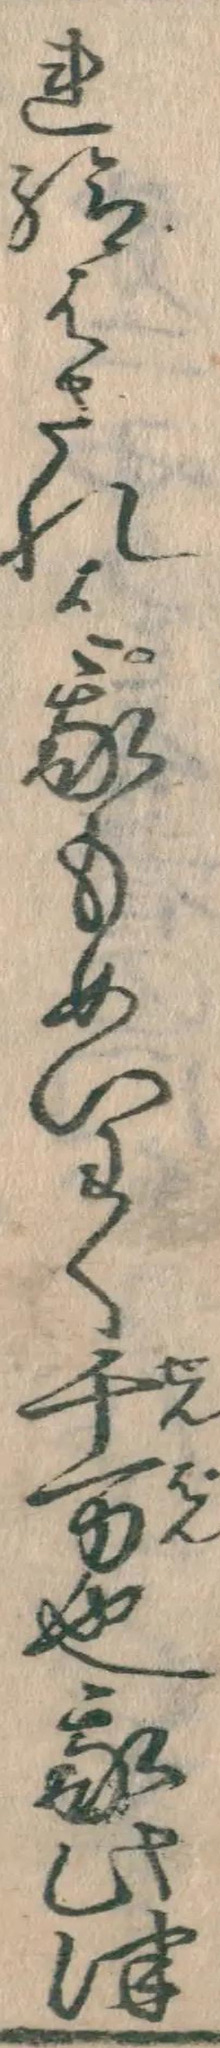れ給はされは。我もめいわく千万也我此つ
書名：竹斎狂歌物語 3巻
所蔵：国立国会図書館 National Diet Library, JAPAN
